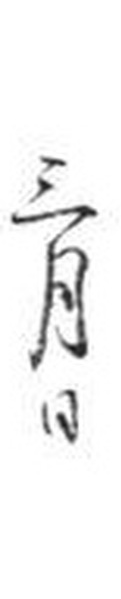三月日
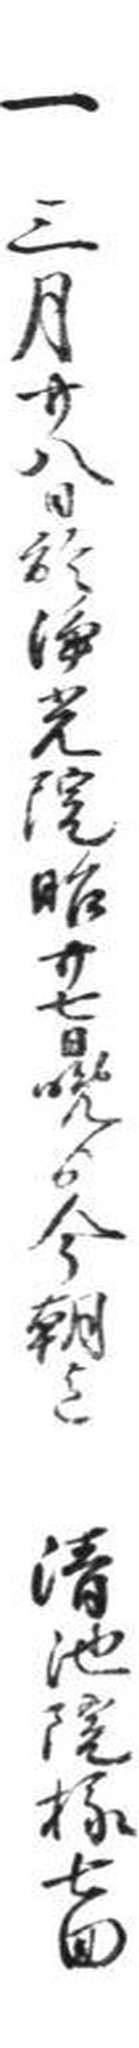一三月廿八日於浄光院昨廿七日暁ゟ今朝迄清池院様七回
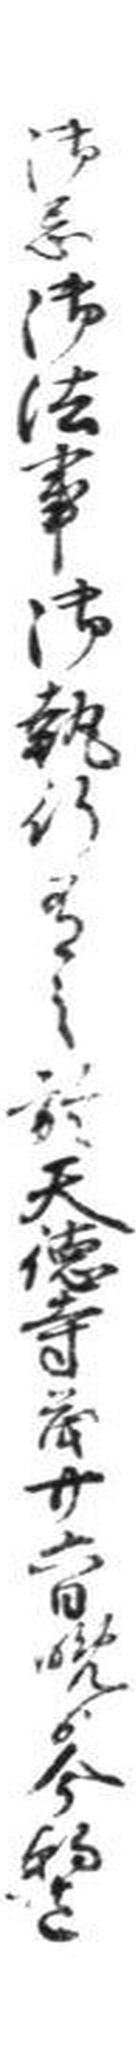御忌御法事御執行有之於天徳寺も廿六日暁ゟ今朝迄
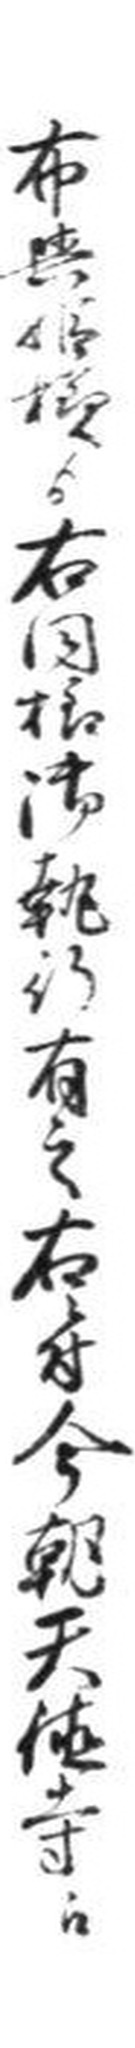布与姫様ゟ右同様御執行有之右ニ付今朝天徳寺江
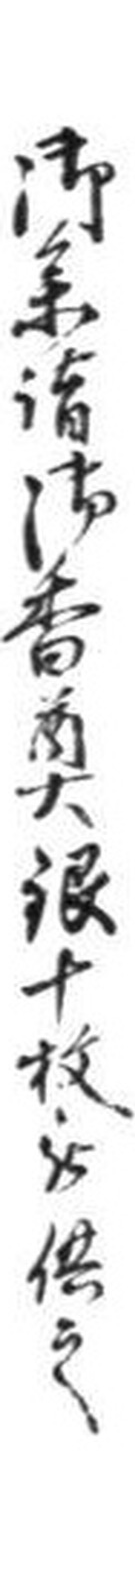御参詣御香奠銀十枚被供之
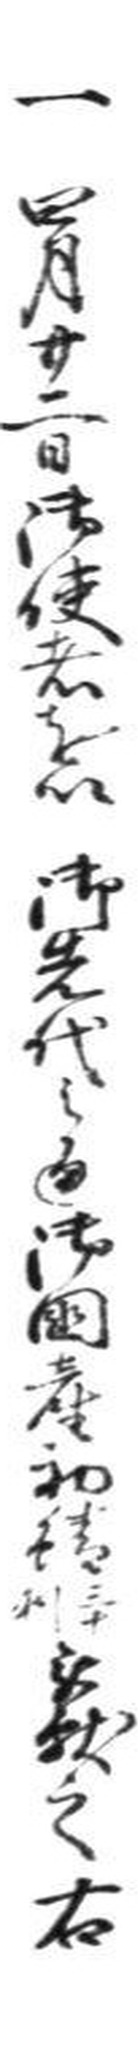一四月廿ニ日御使者を以御先代之通御国産初鯖三十刺被献之右
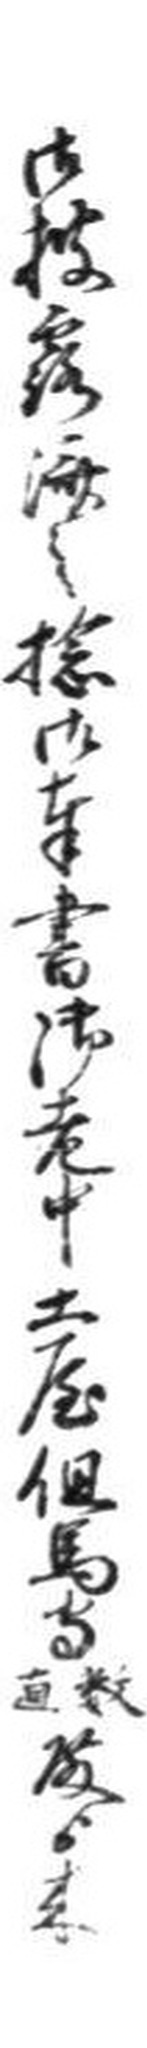御披露済之捻御奉書御老中土屋但馬守数直殿ゟ来
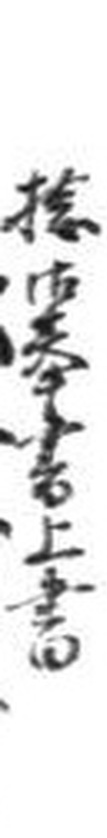捻御奉書上書
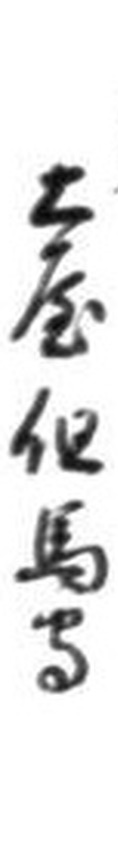土屋但馬守
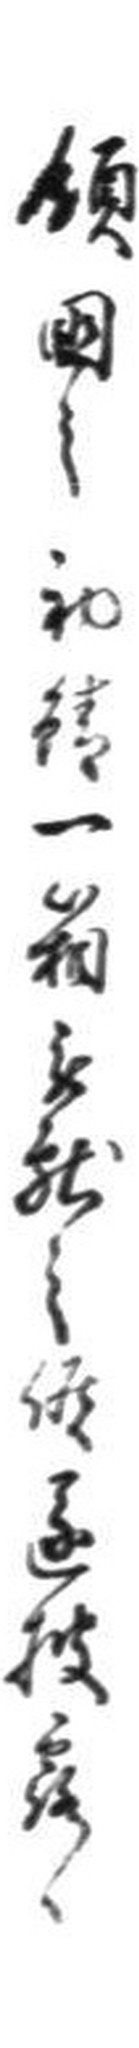領国之初鯖一箱被献之候遂披露候
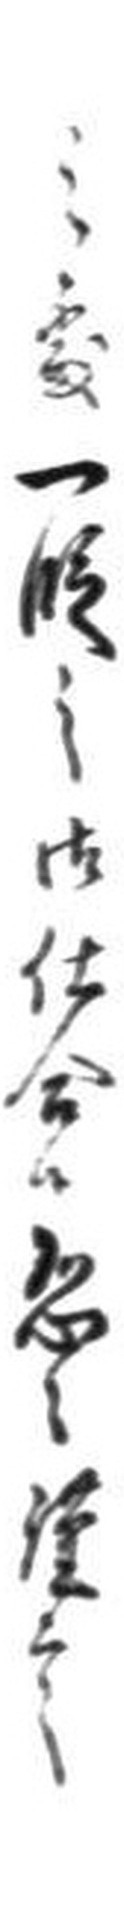之処一段之御仕合候恐々謹言
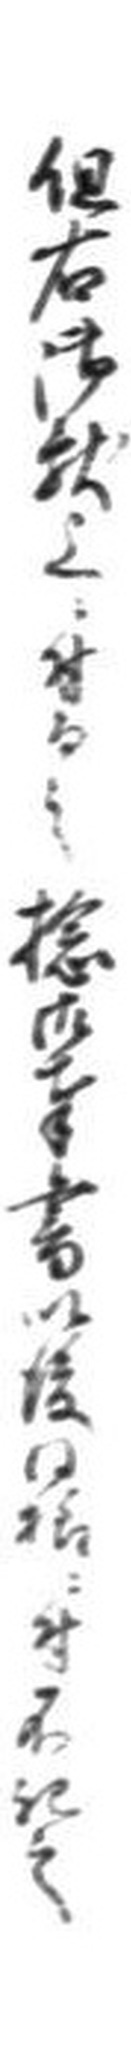但右御献上ニ付而之捻御奉書以後同様ニ付不記之
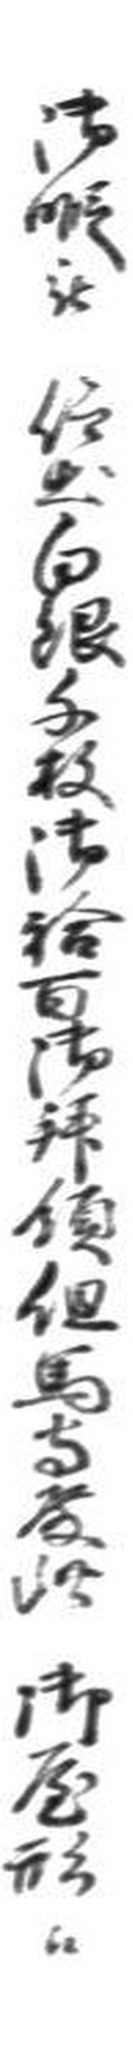御暇被仰出白銀千枚御袷百御拝領但馬守殿此御屋形江
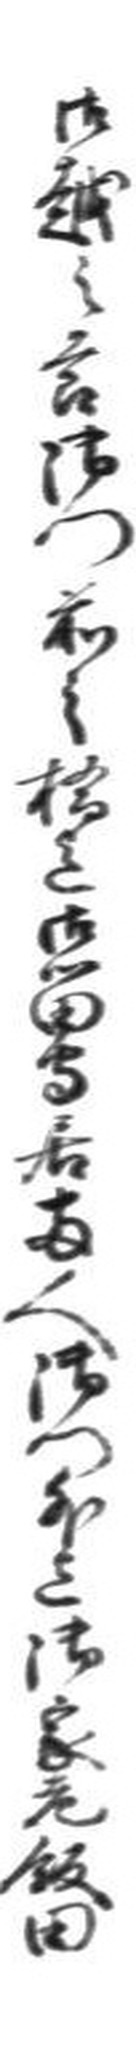御越之節御門前之橋迄御留守居両人御門外迄御家老飯田

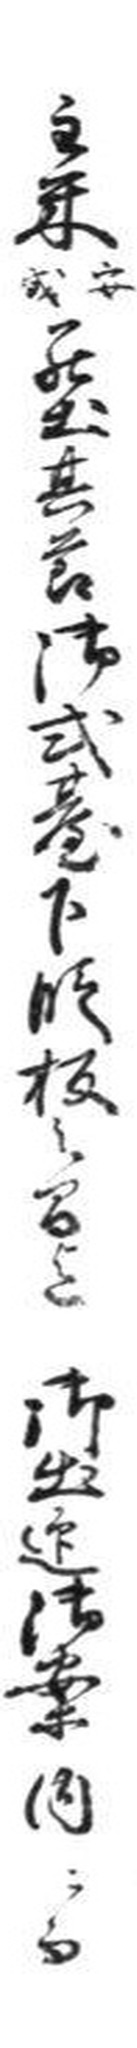主米安成罷出其節御式台下段板之間迄御出迎御案内ニ而
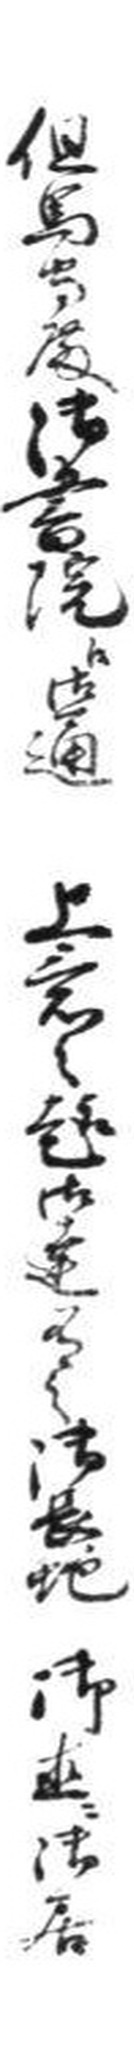但馬守殿御書院江御通上意之趣御達有之御長蚫御直ニ御居
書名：家譜 十三 綱昌公 従寛文元年到延宝五年
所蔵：福井県文書館 Fukui Prefectural Archives
